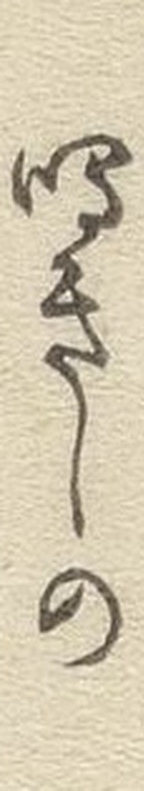鳴きしの
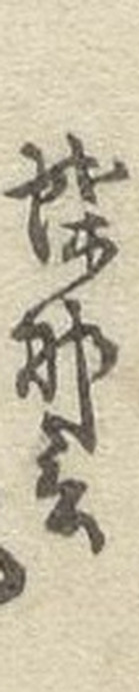蝶那言
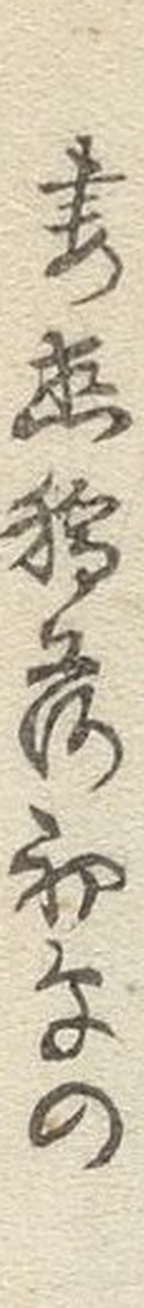妻恋稲荷初午の
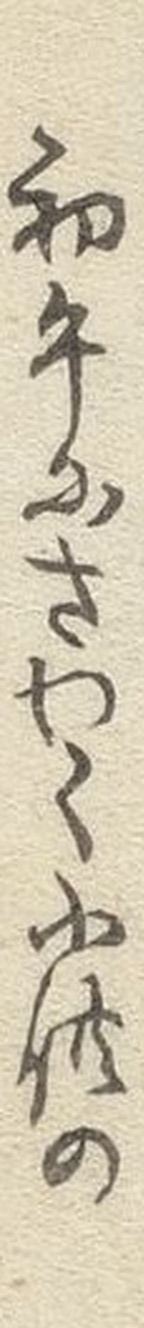初午にさわく小供の
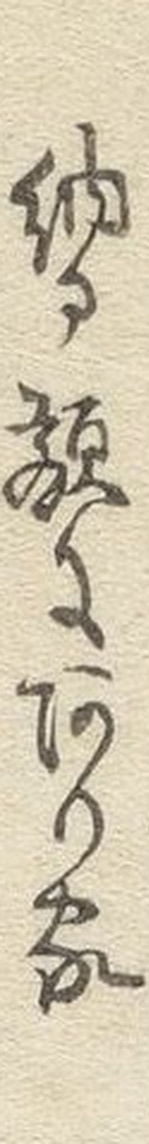納る額にありか
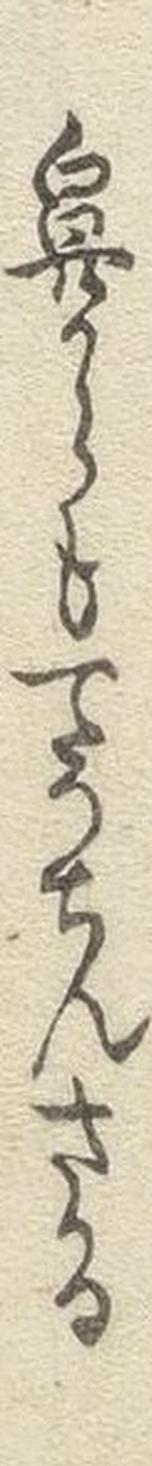鼻からもてうちんさかる
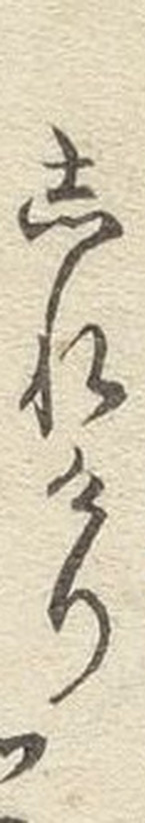しれけり
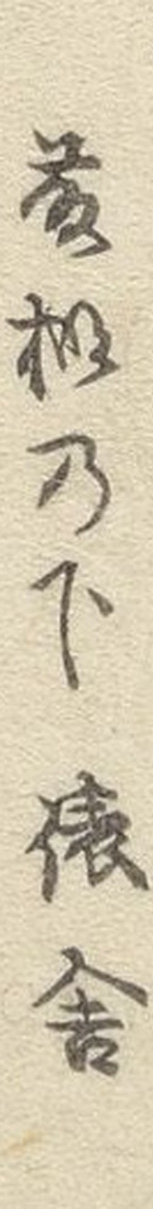藤棚の下俵舎
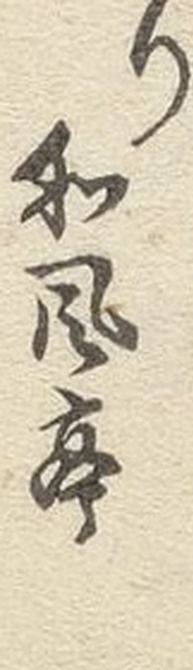和風亭
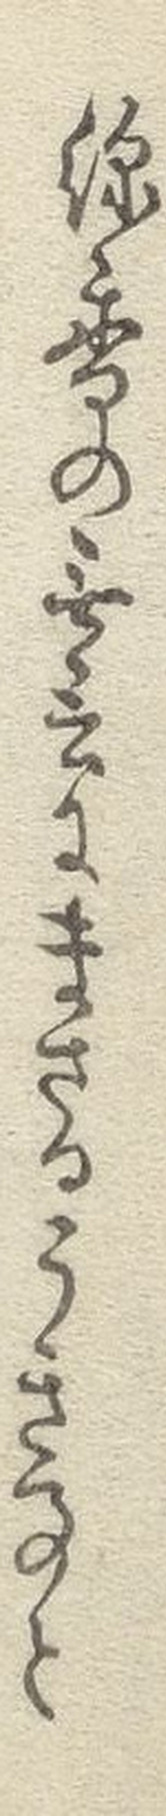線香の無言にまさるうき事と
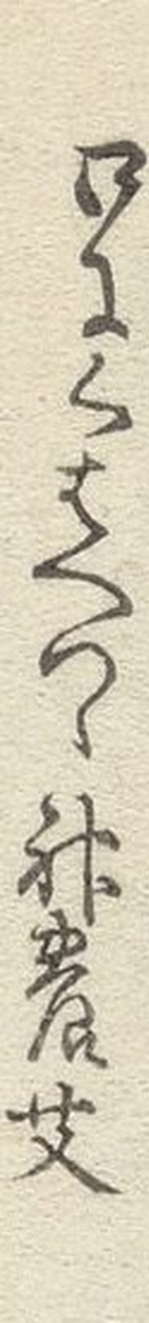口にくはへつゝ神農艾道草
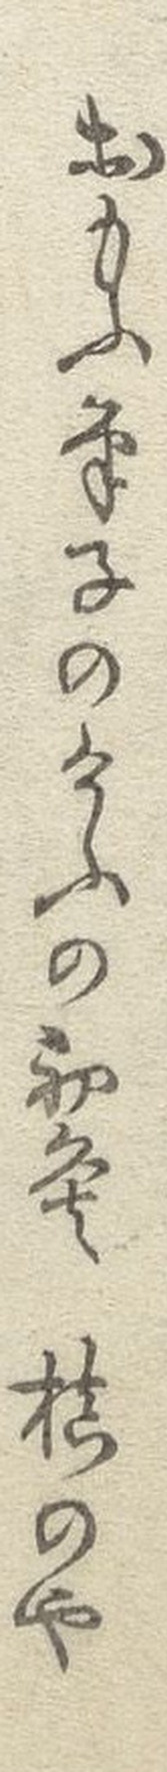おもふ筆子のけふの初灸槙のや
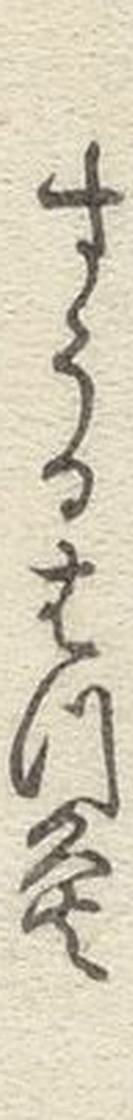すうるはつ灸
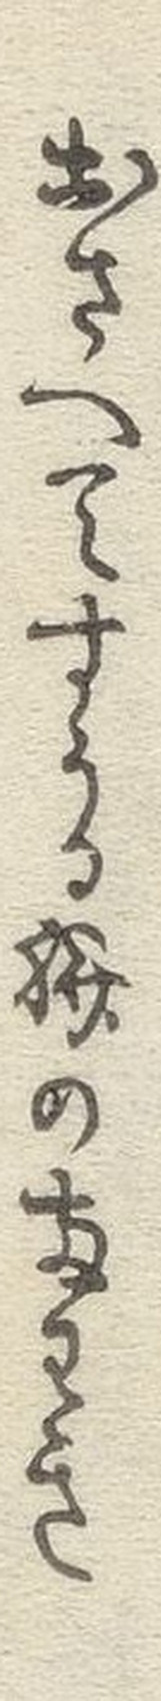おさへてすうる臍の両わき風彦
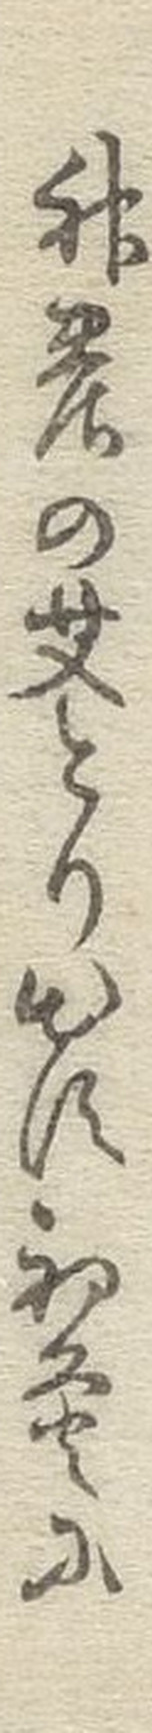神農の艾とり出す初灸に
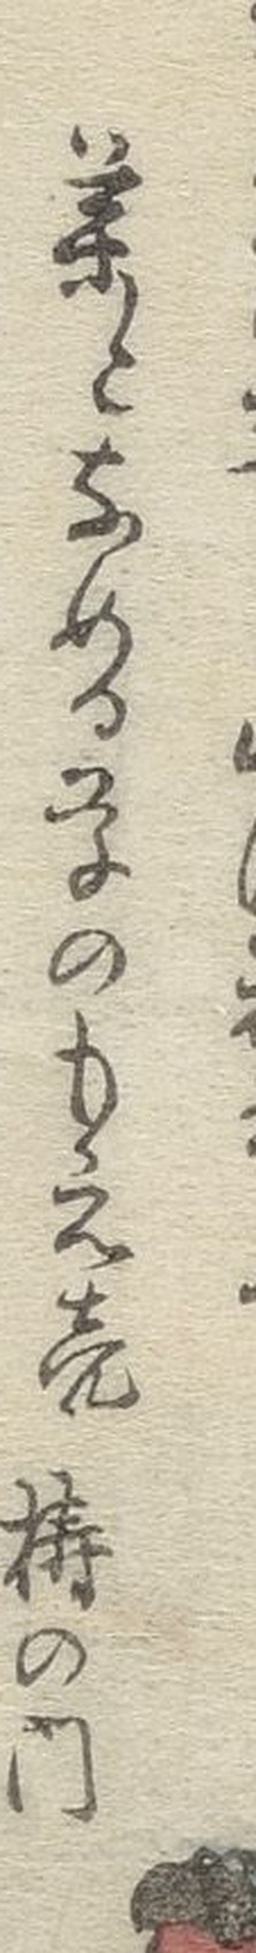薬となめる草のもえ売梼の門
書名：Picture Album of People with Kyōka (Light Verse) (Kyōka shiki jinbutsu 狂歌四季人物)
